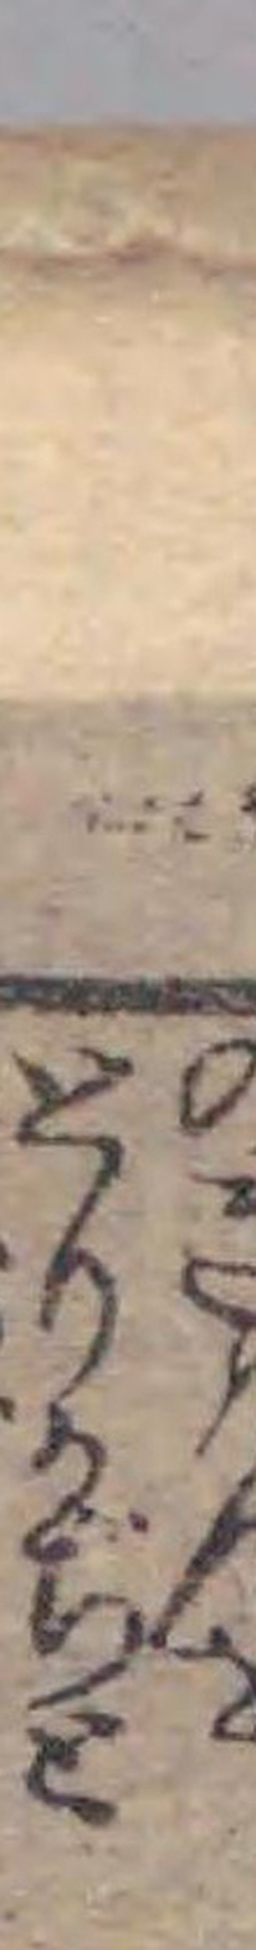とりかぢと
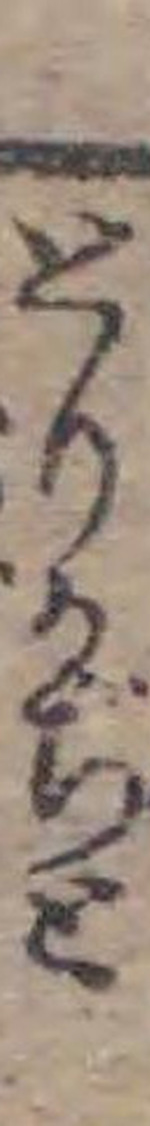とりかぢと
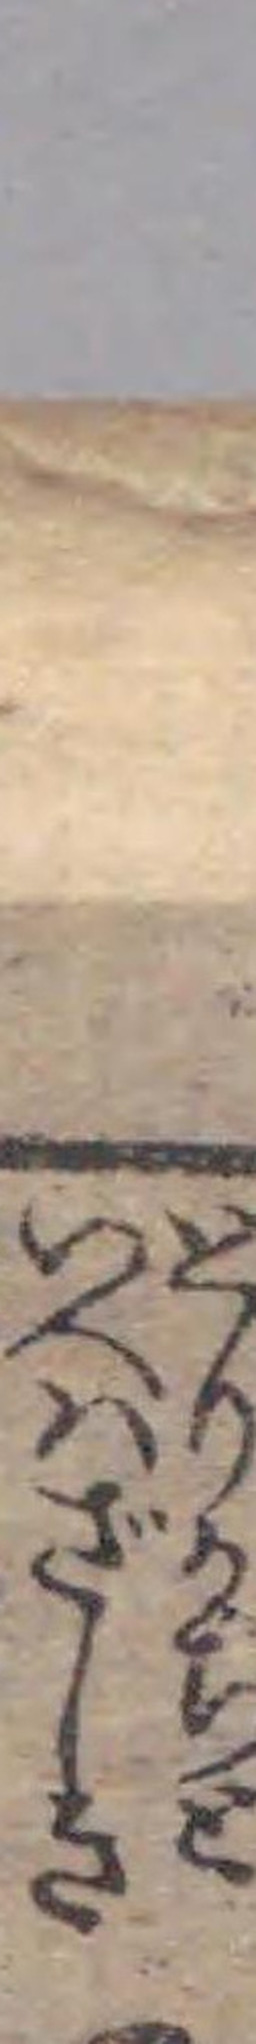いへはざしき
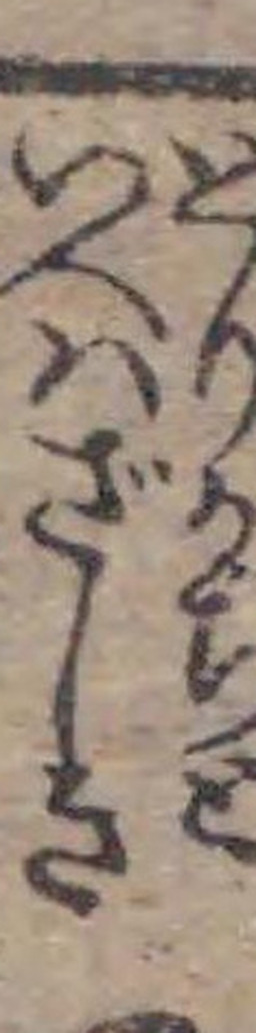いへはざしき
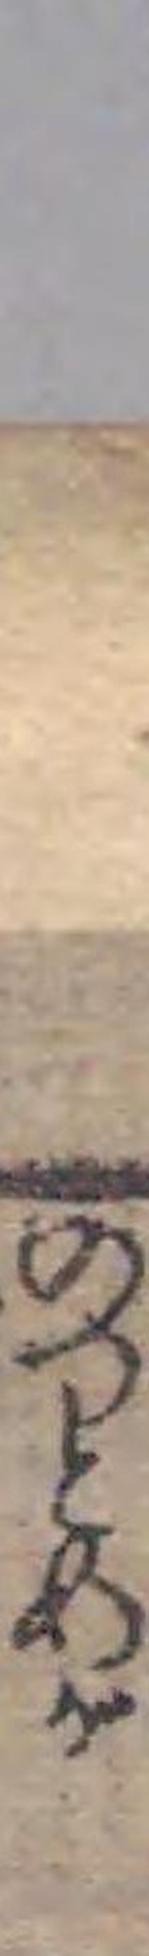のつとめが
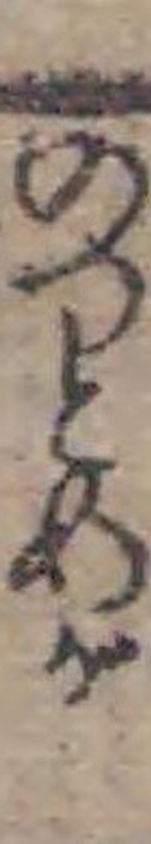のつとめが
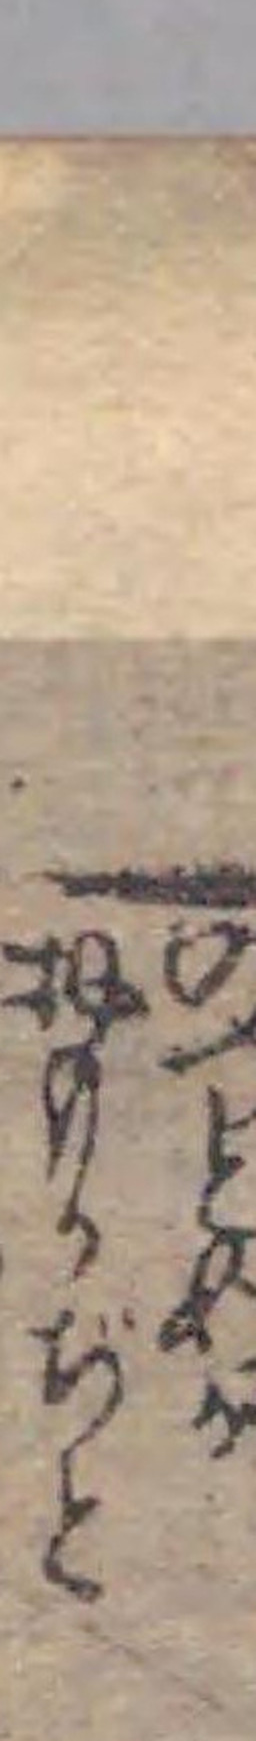おもかぢと
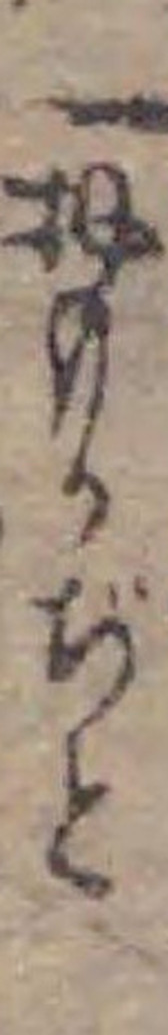おもかぢと
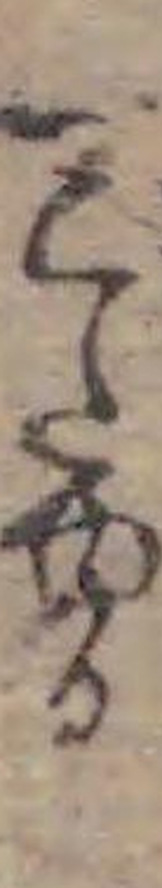こたゆる
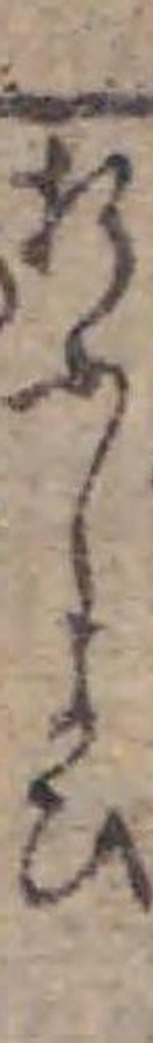折ふしよひ
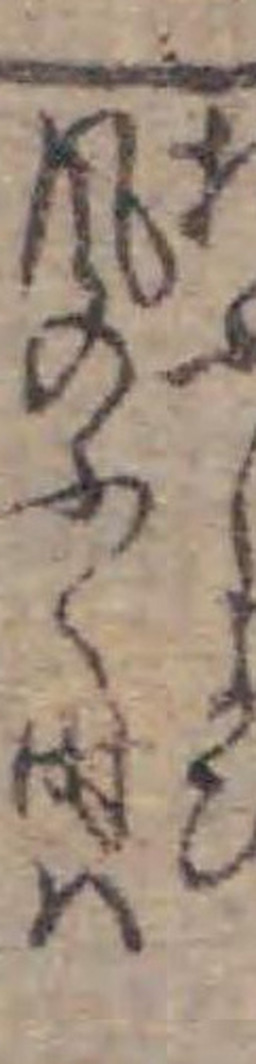風のふく時は
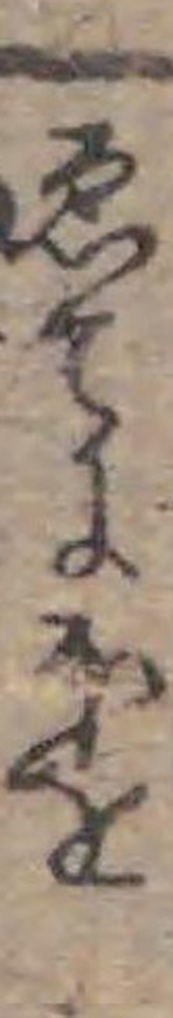ゑてにほを
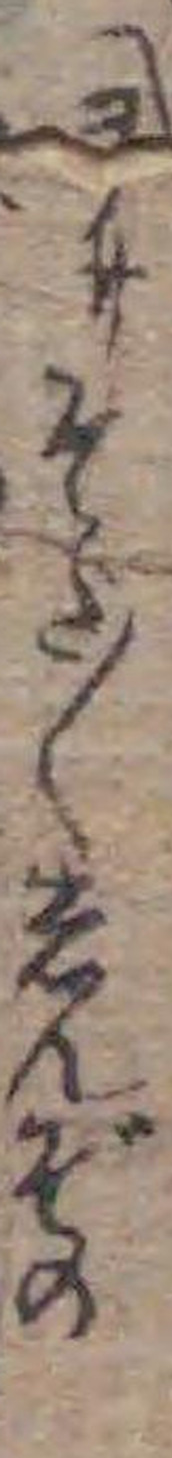〽ヲサそた〳〵しんぞの
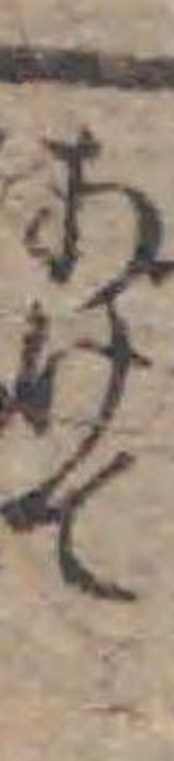あけて
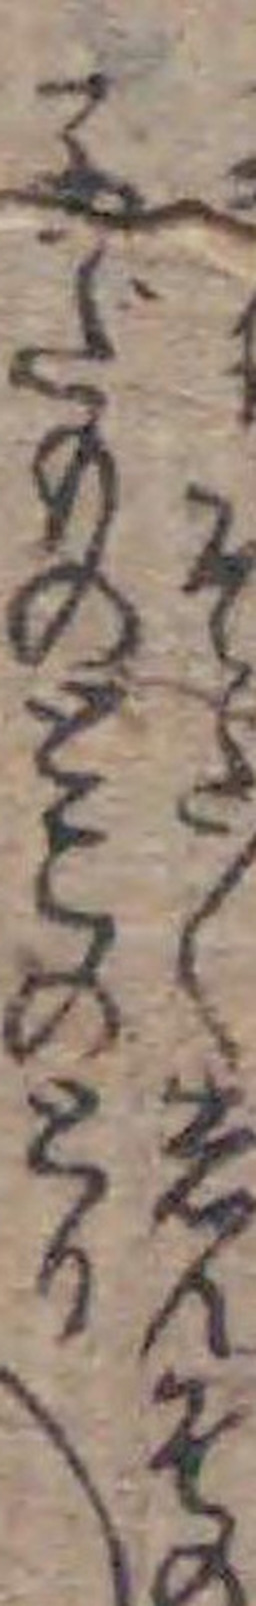子だものとこのとり
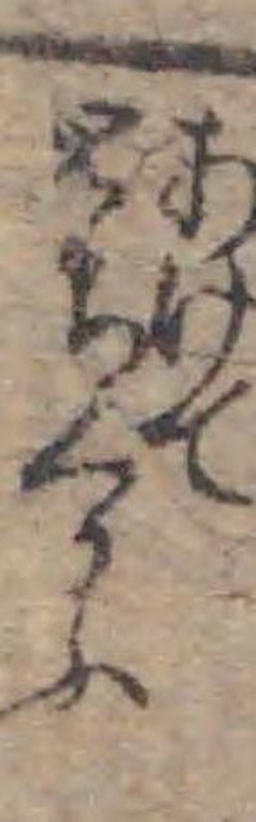とちくるふ
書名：北国順礼唄方便 : 3巻
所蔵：国立国会図書館 National Diet Library, JAPAN
